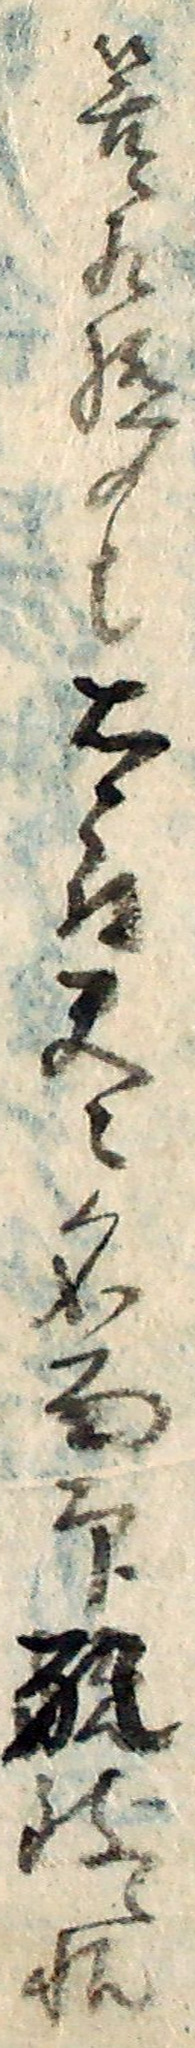筈に相極め申候右に付夫々名面印形致候様
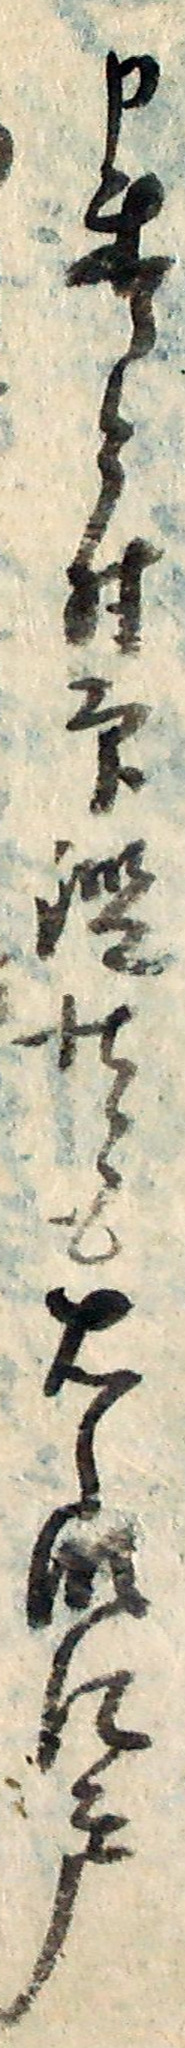申来候に付印鑑仕とも右之段江戸
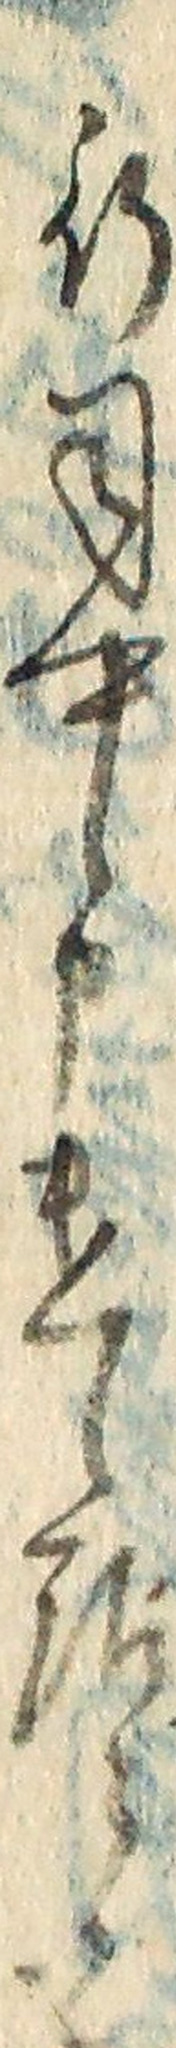行司中申遣候所に候以上
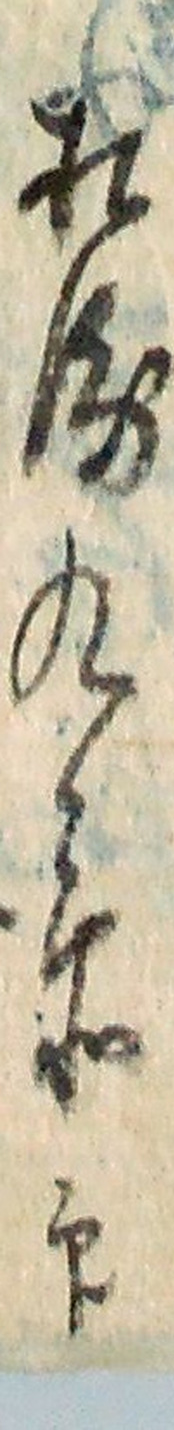松浦九兵衛印
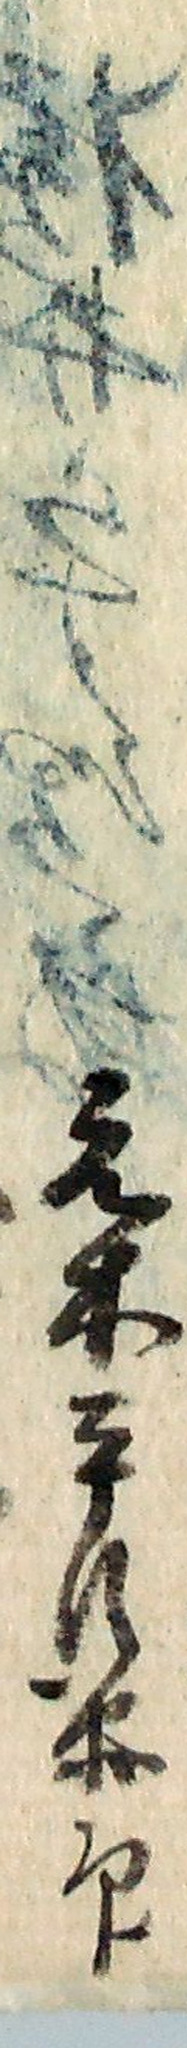元木平次兵衛印
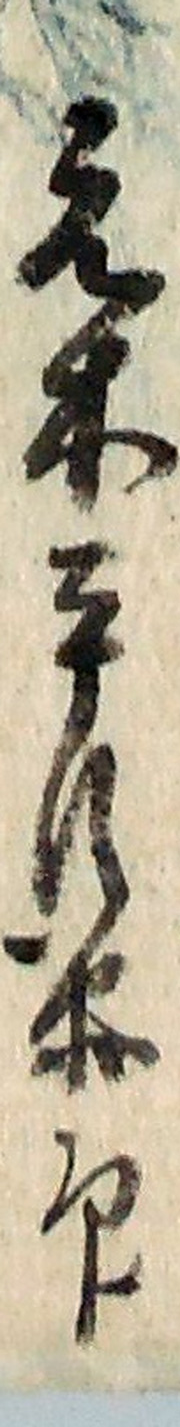元木平次兵衛印
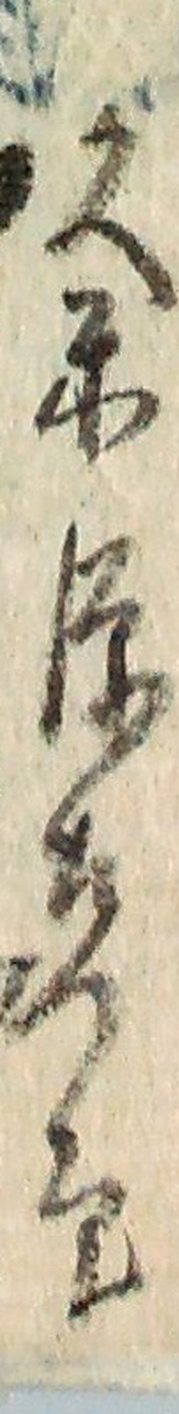久米源左衛門印
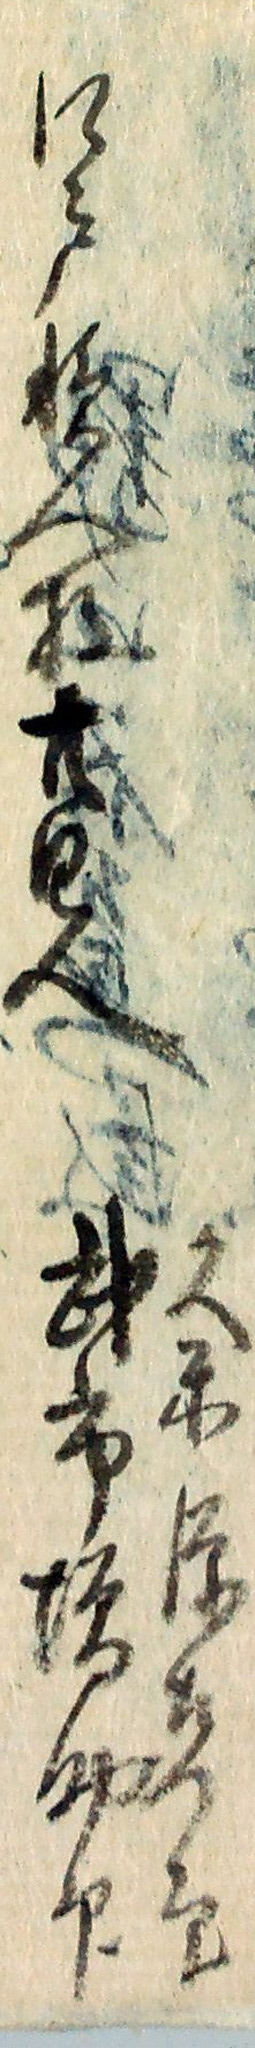江戸積人扱共四人武市増助印

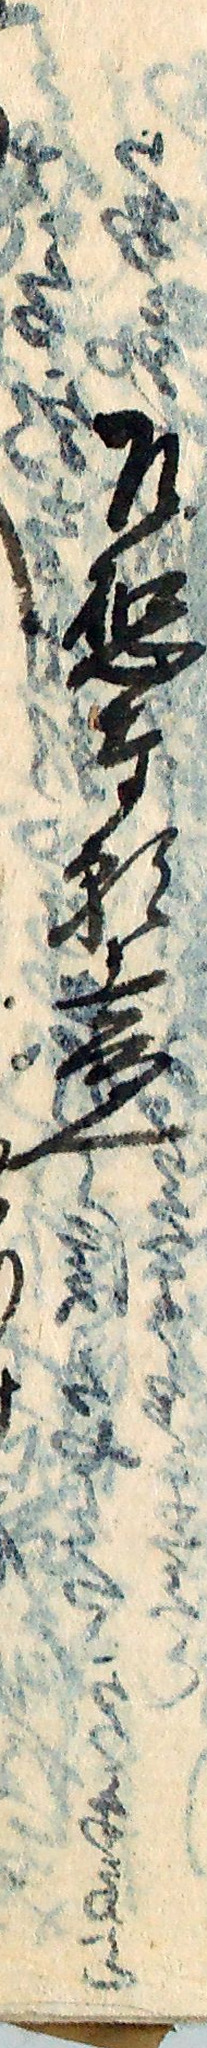乍恐奉願上覚
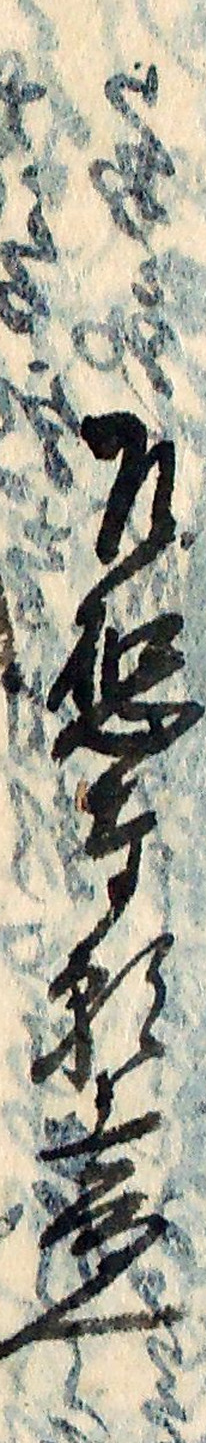乍恐奉願上覚
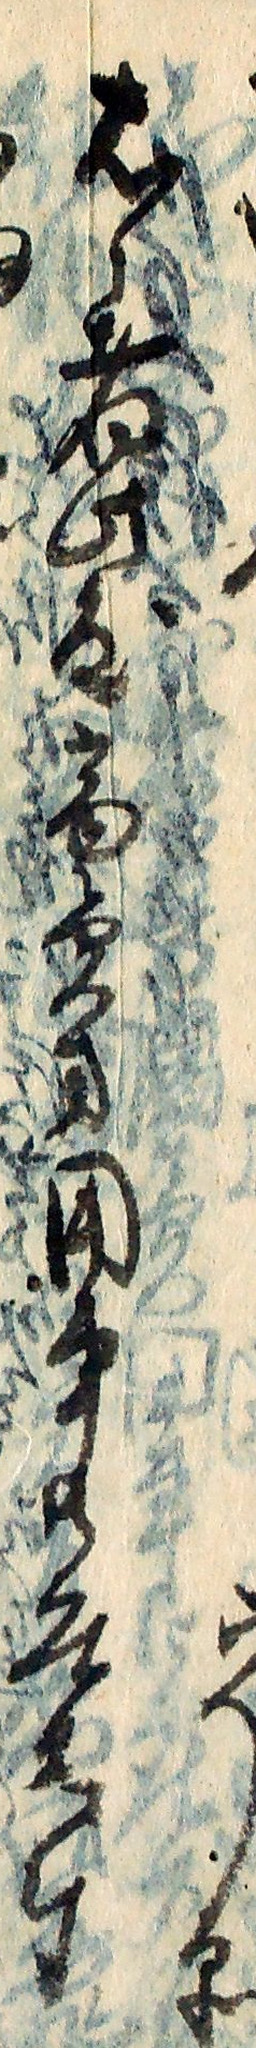右之者此度商売方用事御座候に付
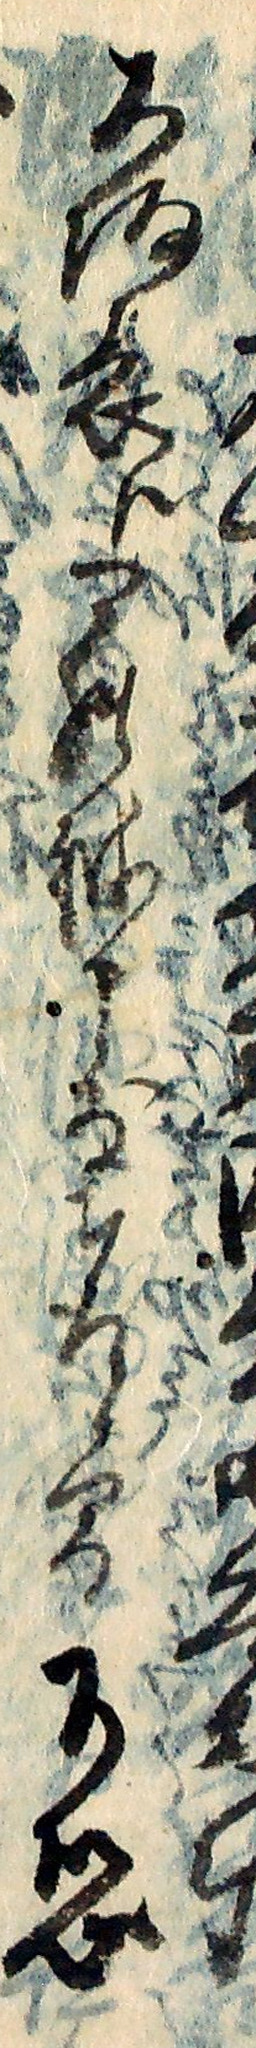大坂表え罷越申度奉存候間乍恐
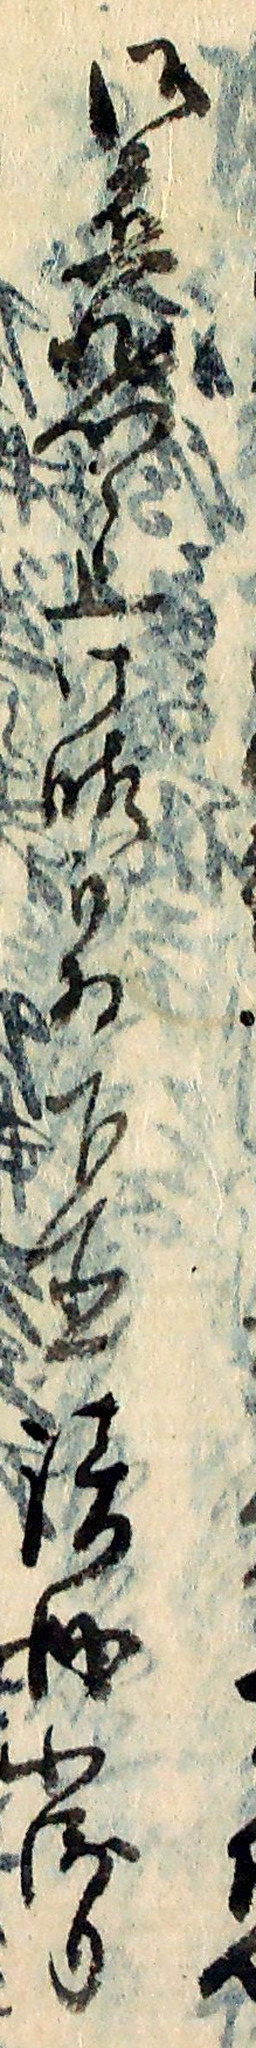御慈悲之上御暇被為下置淡州小渡り
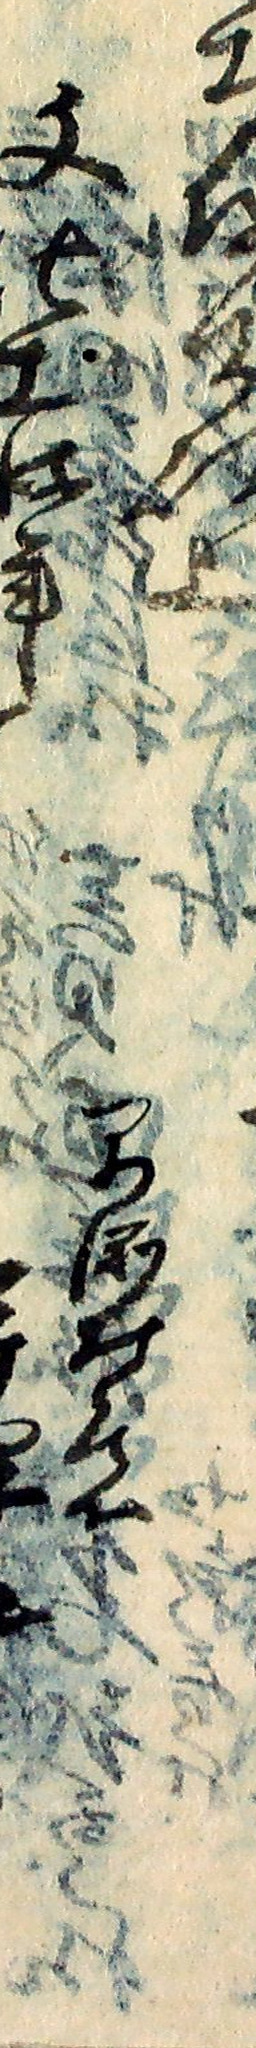文化十一戌年早淵村庄屋
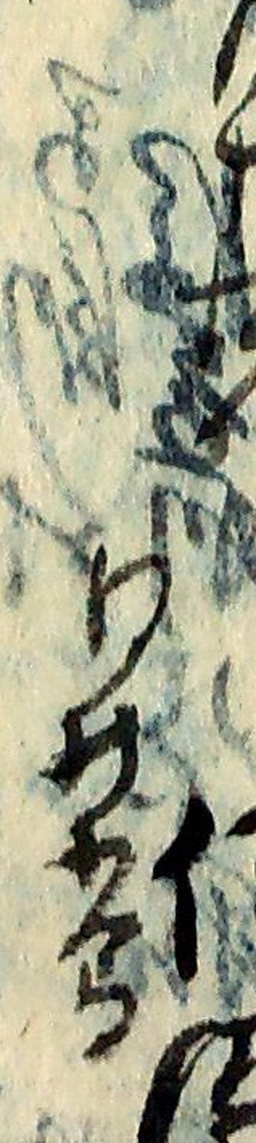同村五人与
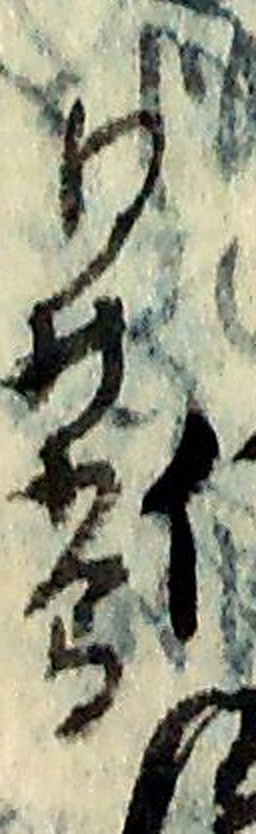同村五人与
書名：諸御願書控(後藤氏壱番）
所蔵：鳴門教育大学 Naruto University of Education
